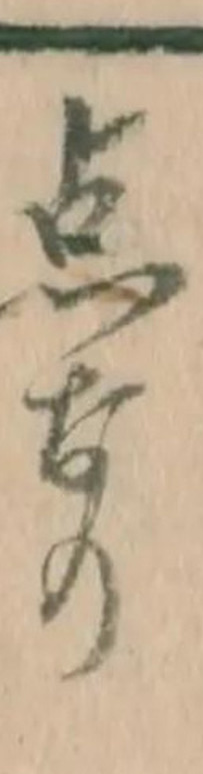点なり

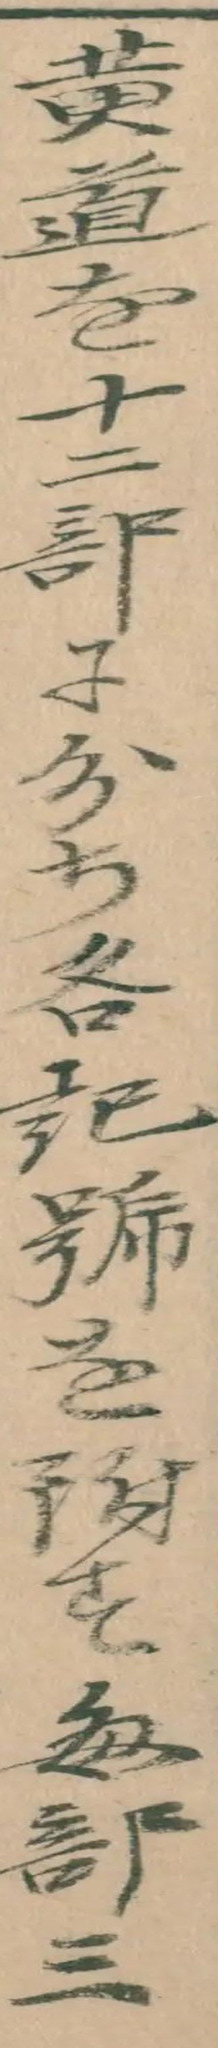黄道を十二部に分ち各記号を附す毎部三
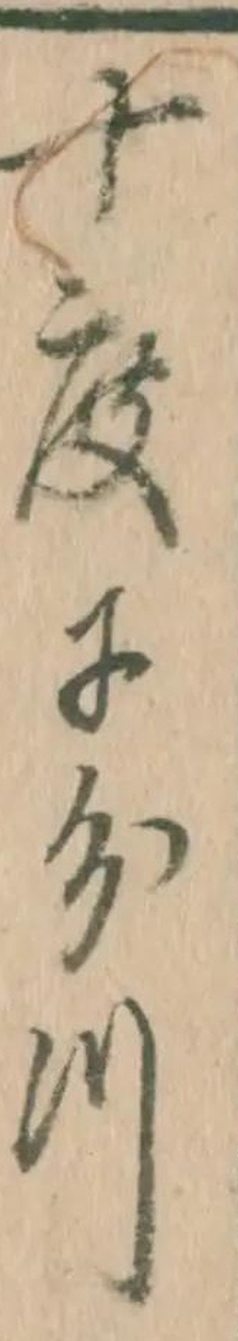十度に分つ
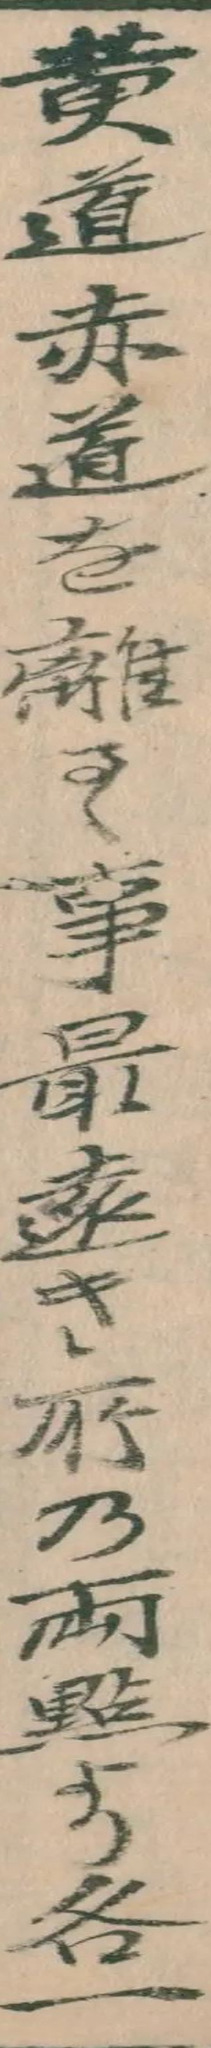黄道赤道を離るゝ事最遠き所の両点より各一
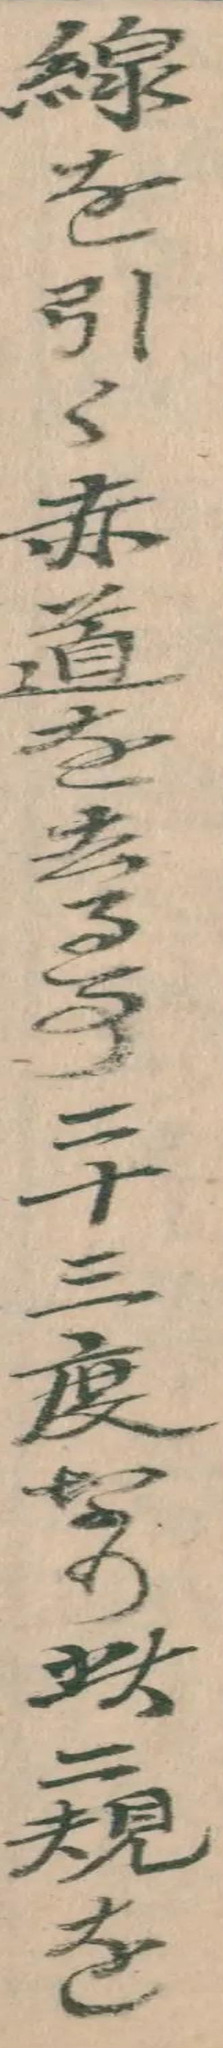線を引く赤道を去る事二十三度なり此二規を
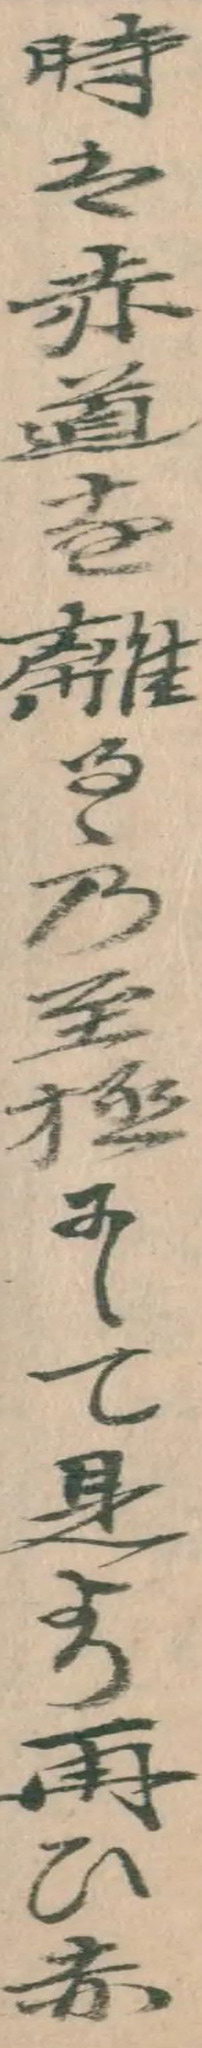時は赤道を離るゝの至極にして是より再ひ赤
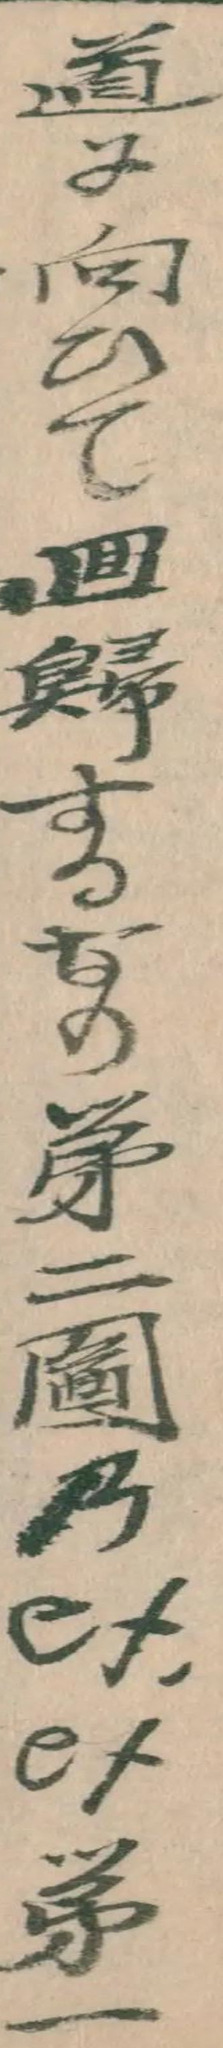道に向ひて回帰するなり第二図の,第一
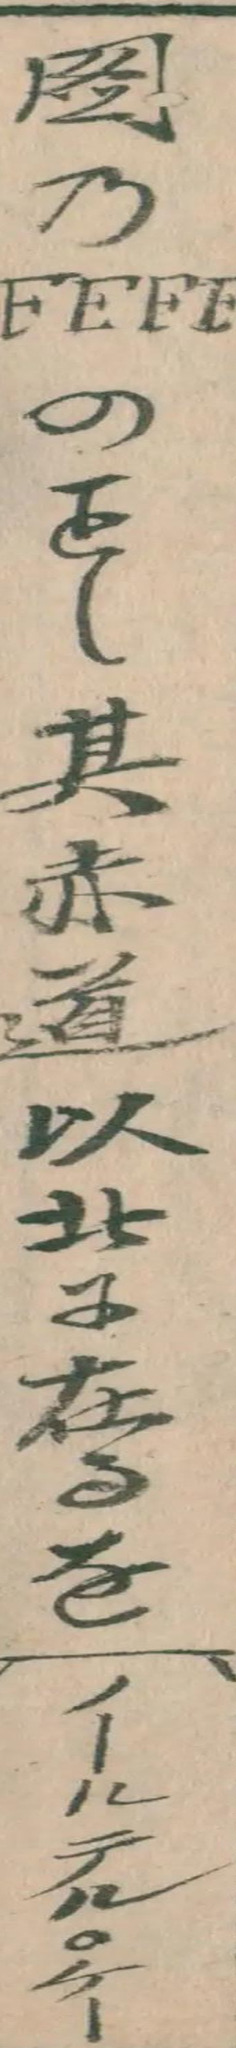図ののことし其赤道以北に在るを(ノールテル

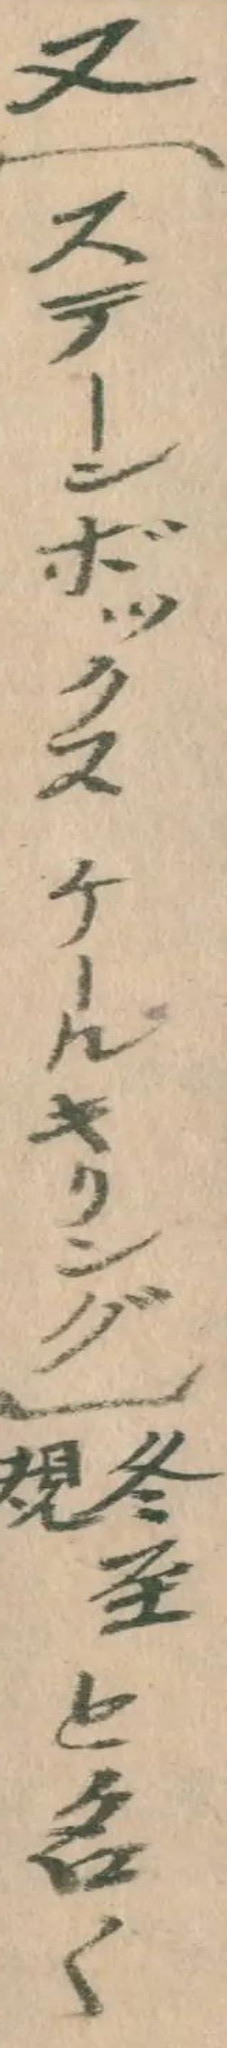又(ステーンボックスケールキリング)冬至規と名く
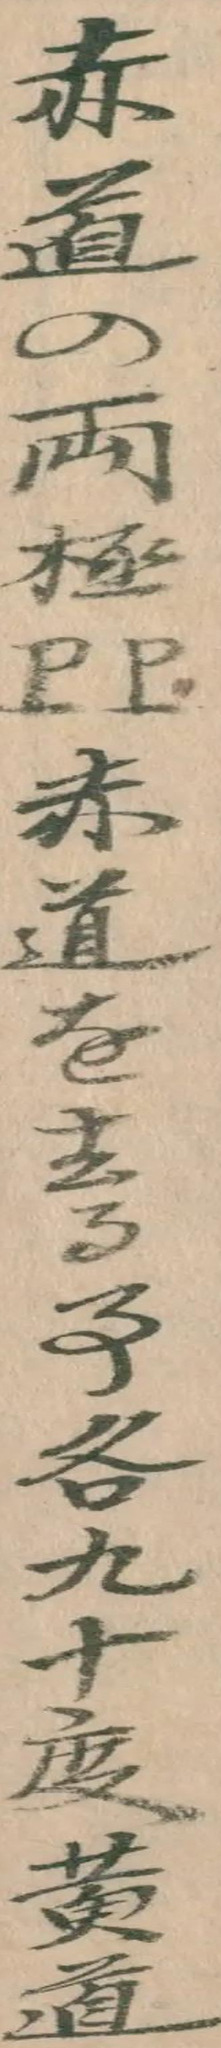赤道の両極赤道を去る事各九十度黄道
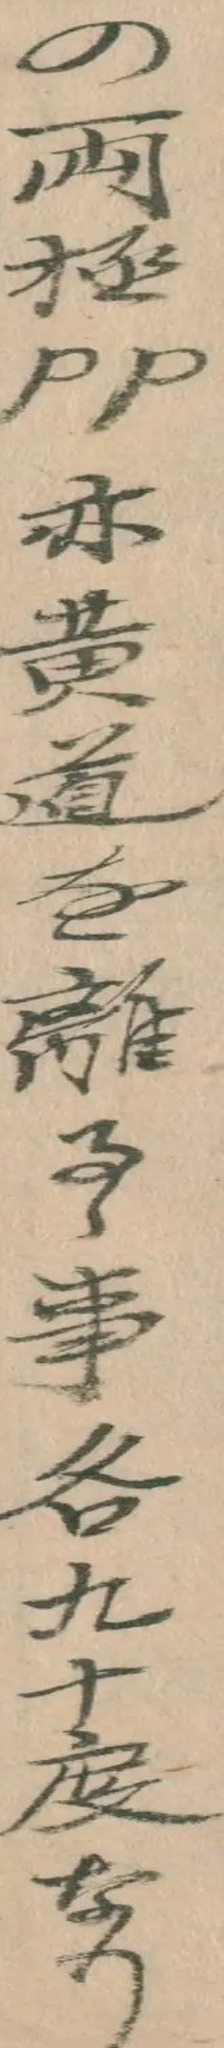の両極亦黄道を離るゝ事各九十度なり
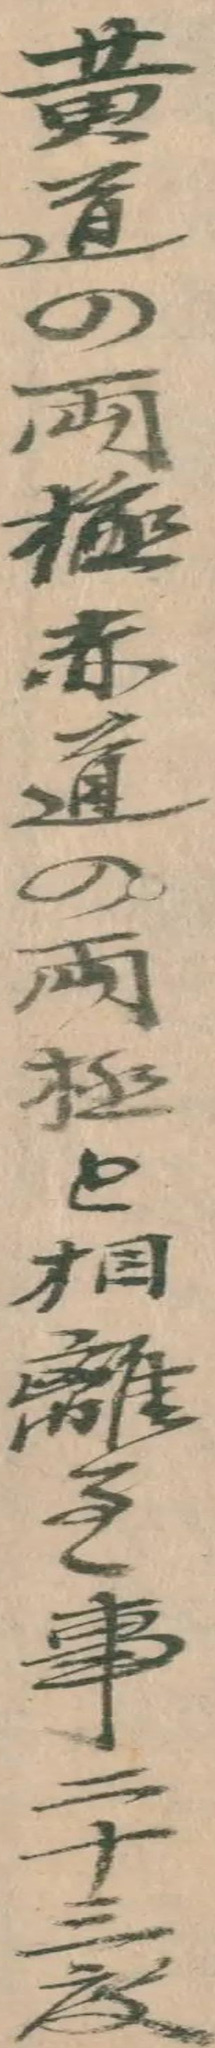黄道の両極赤道の両極と相離るゝ事二十三度
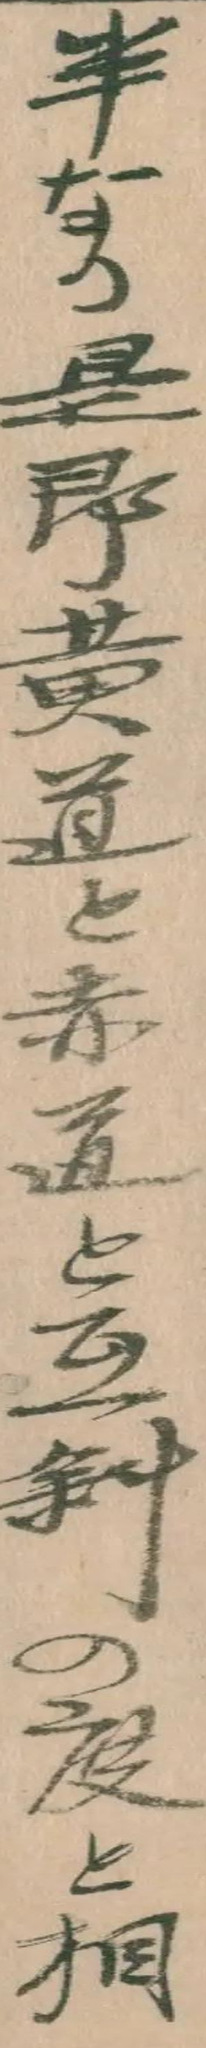半なり是即黄道と赤道と互斜の度と相
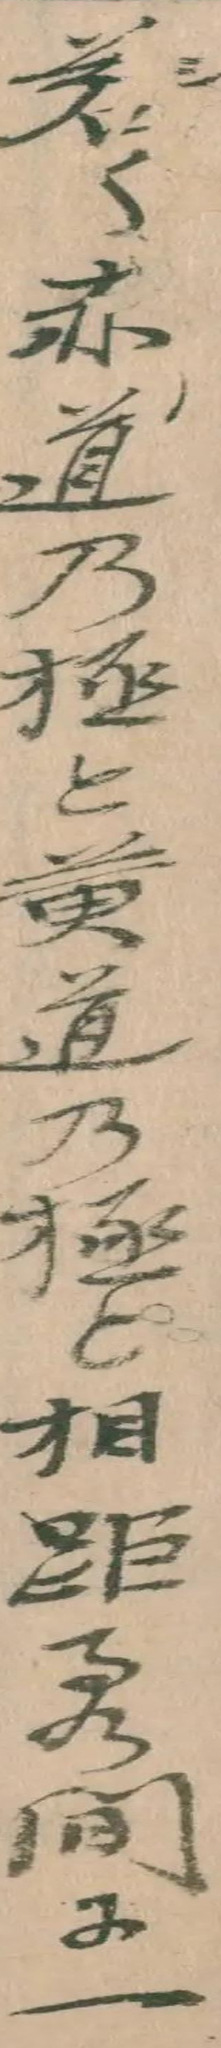若く赤道の極と黄道の極と相距るの間に一
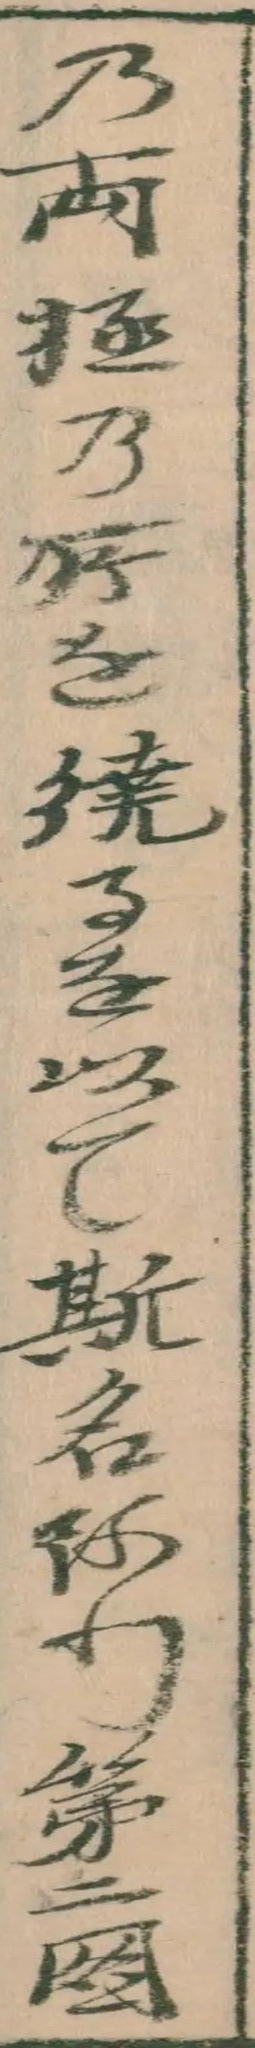の両極の所を繞るを以て斯名あり第二図
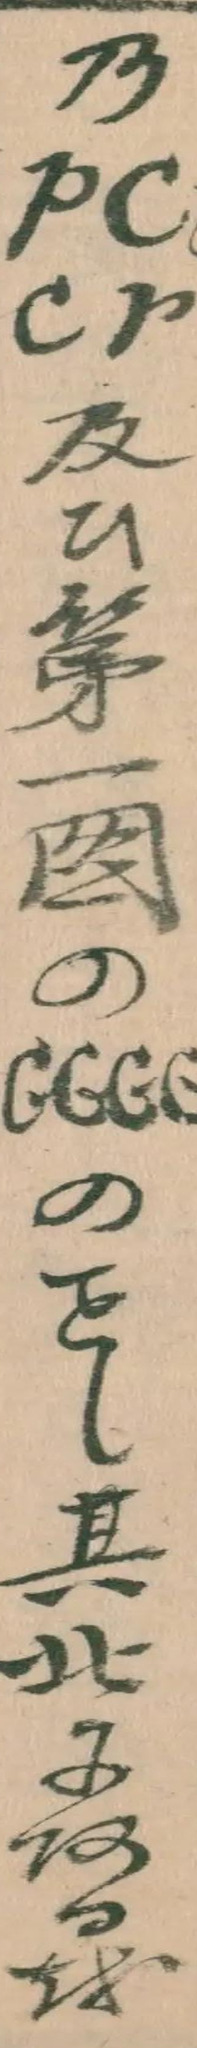の及ひ第一図ののことし其北にあるを
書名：新釈輿地図説
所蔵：国立国会図書館 National Diet Library, JAPAN
